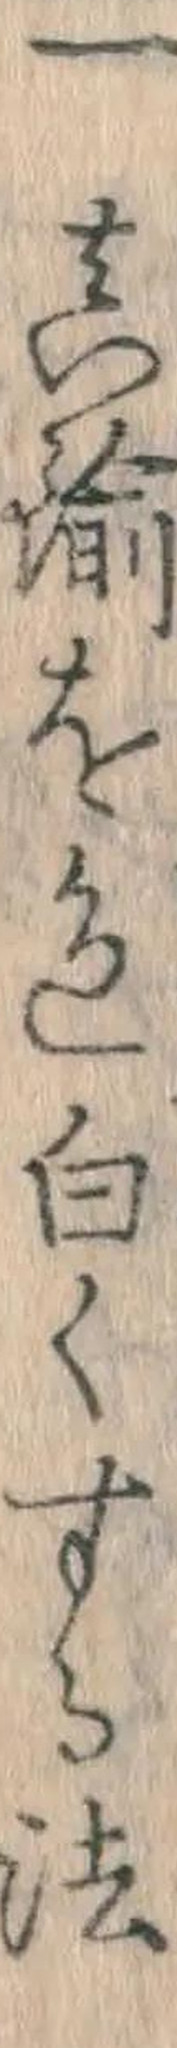一真鍮を色白くする法
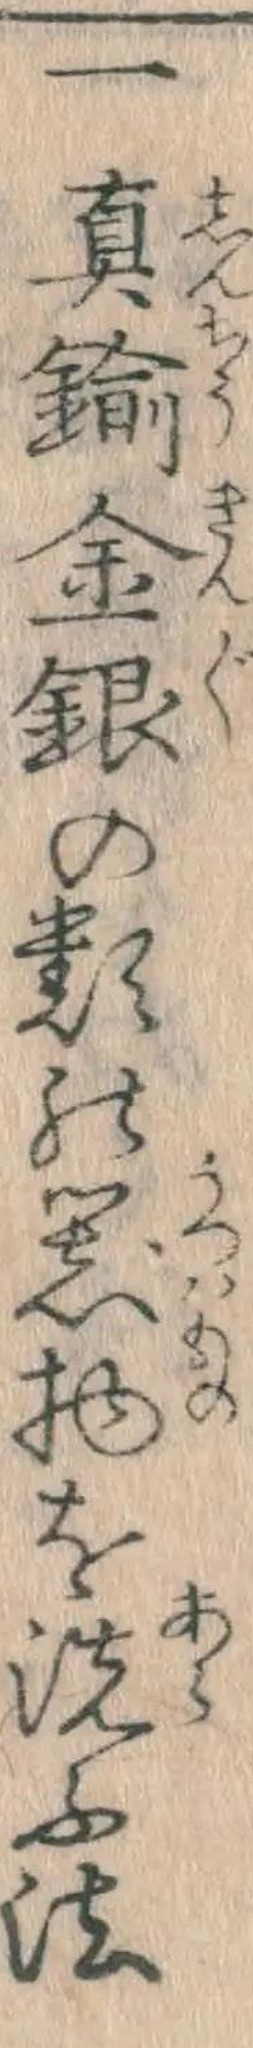一真鍮金銀の類の器物を洗ふ法
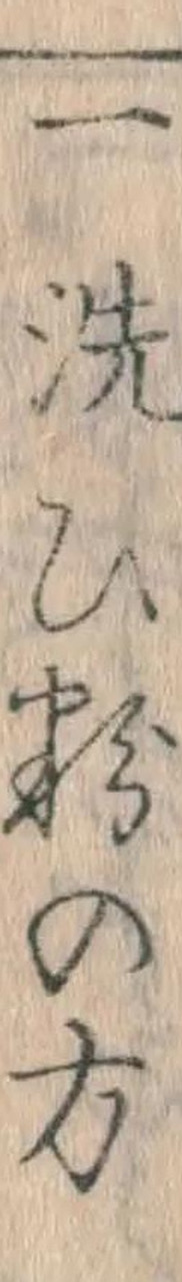一洗ひ粉の方
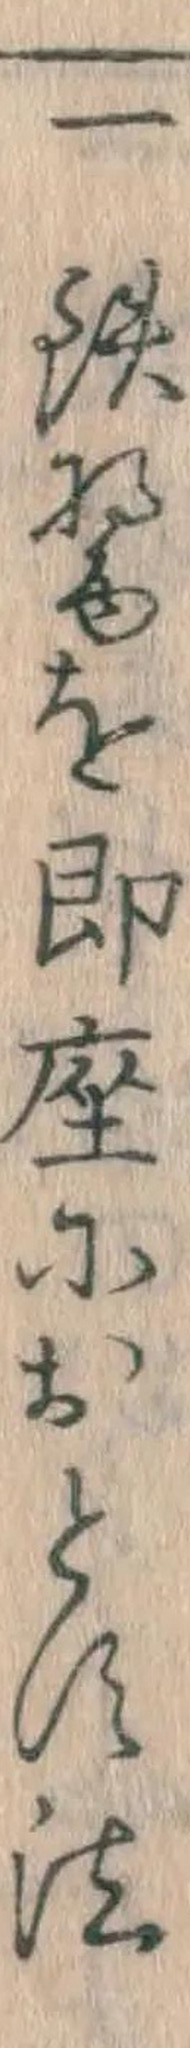一鉄醤を即座におとす法
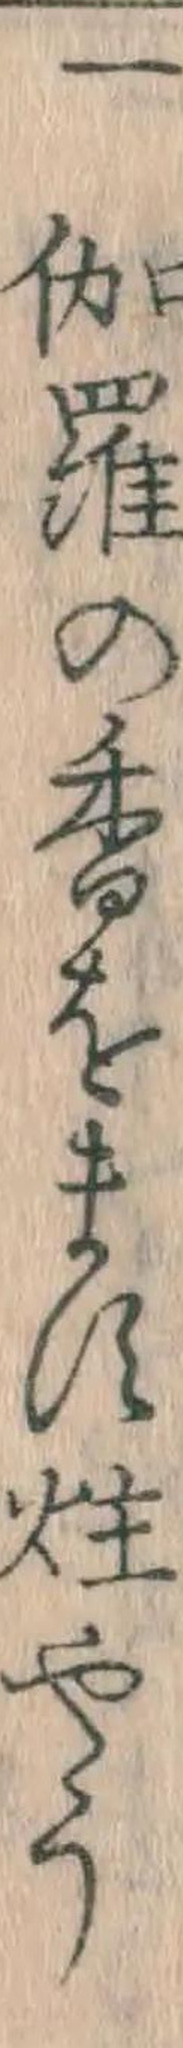一伽羅の香をます炷やう
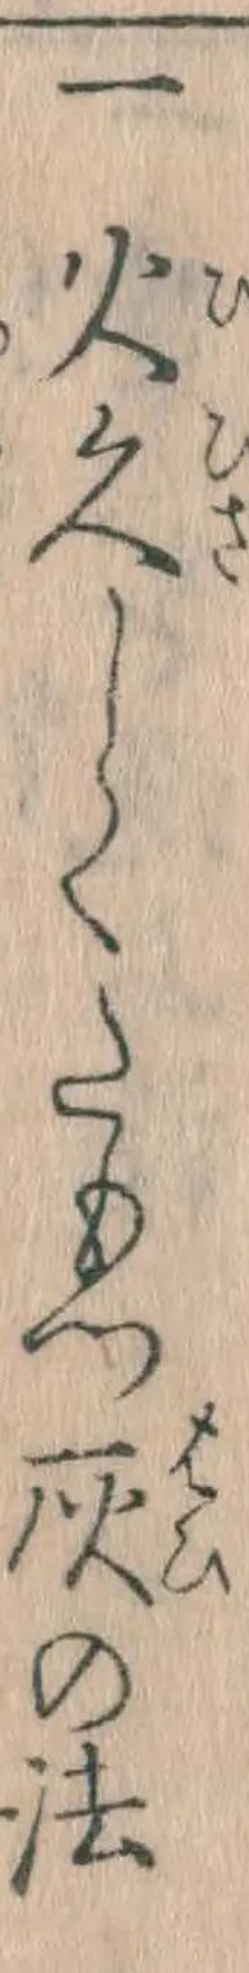一火久しくたもつ灰の法
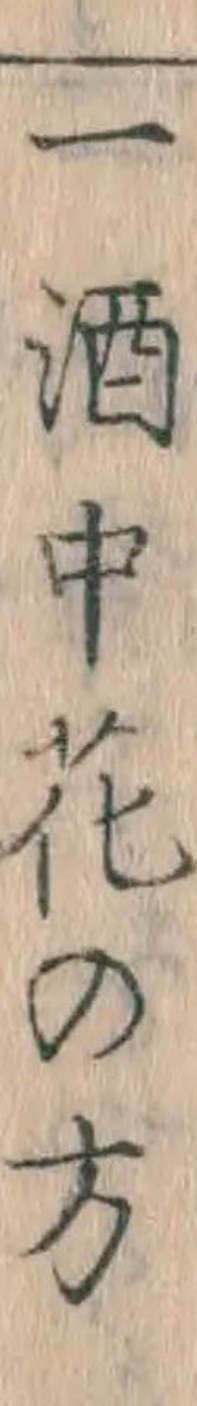一酒中花の方
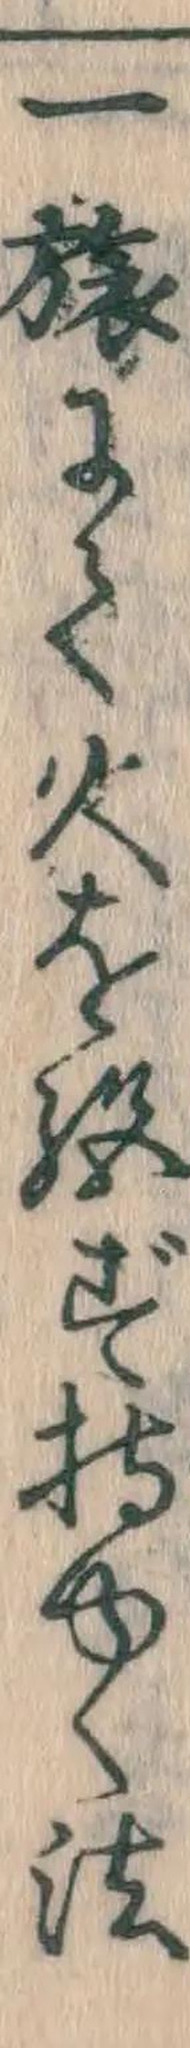一旅にて火を絶ず持ゆく法
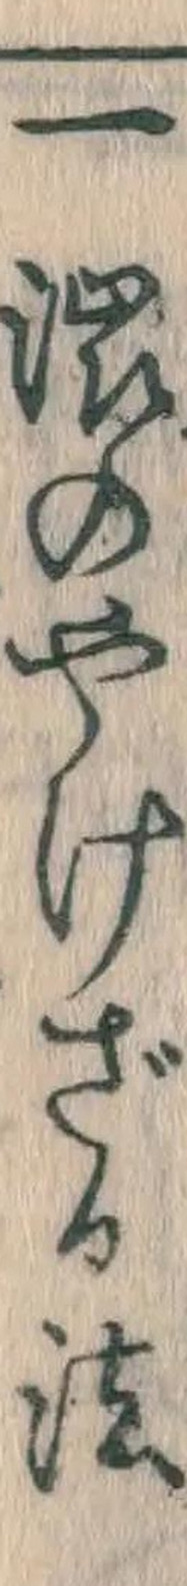一渋のやけざる法
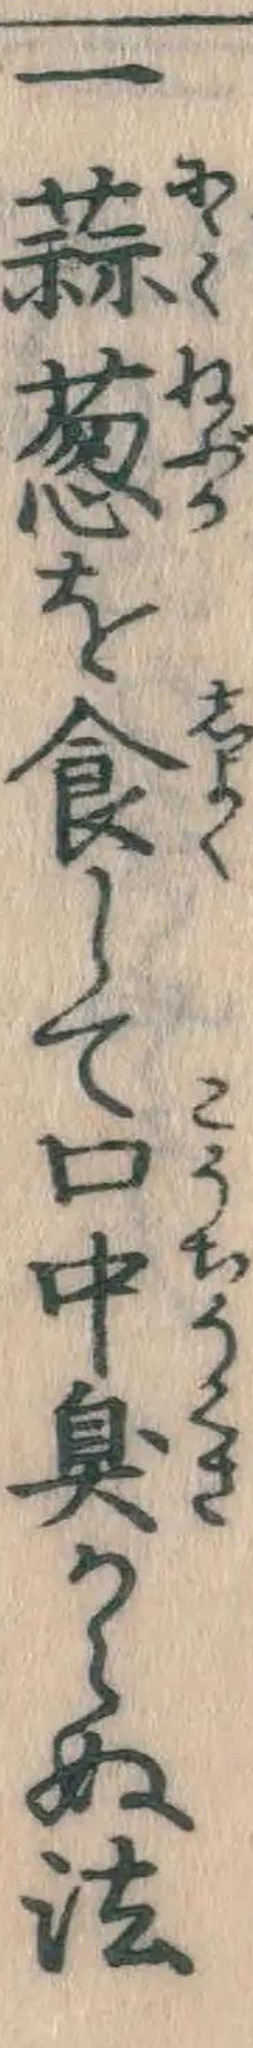一蒜葱を食して口中臭からぬ法
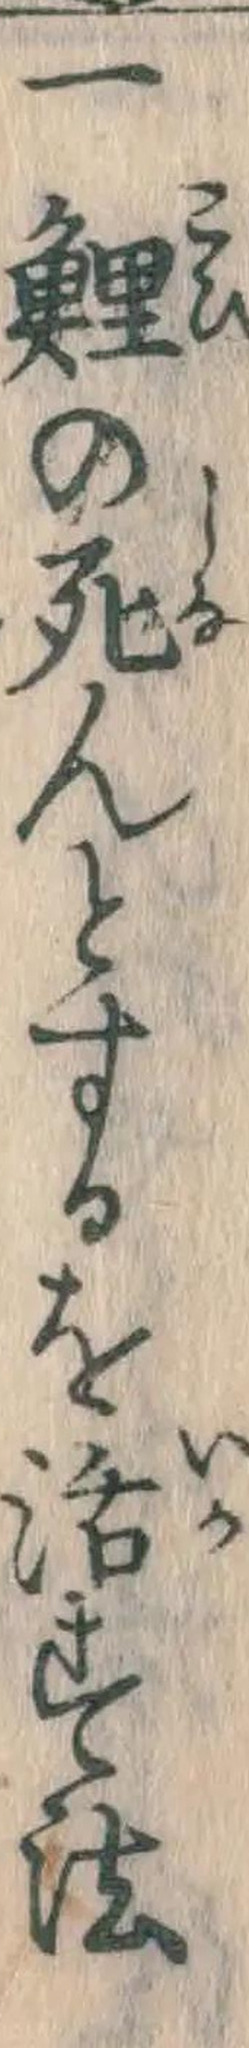一鯉の死んとするを活す法
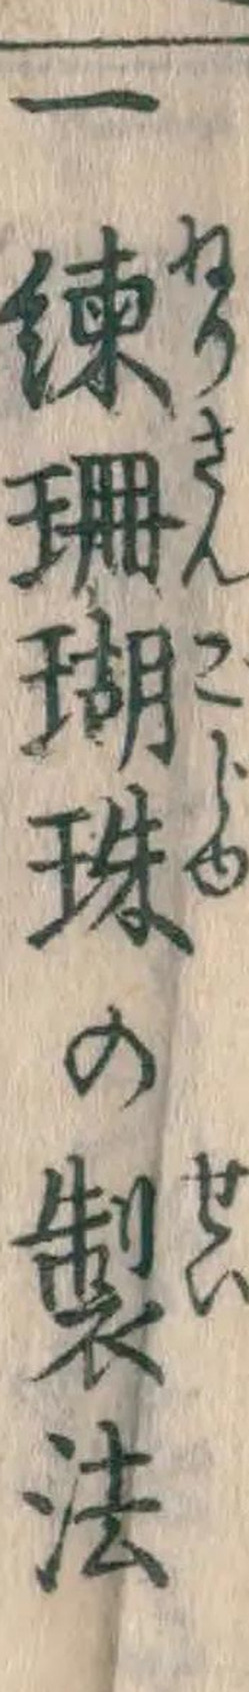一練珊瑚珠の製法
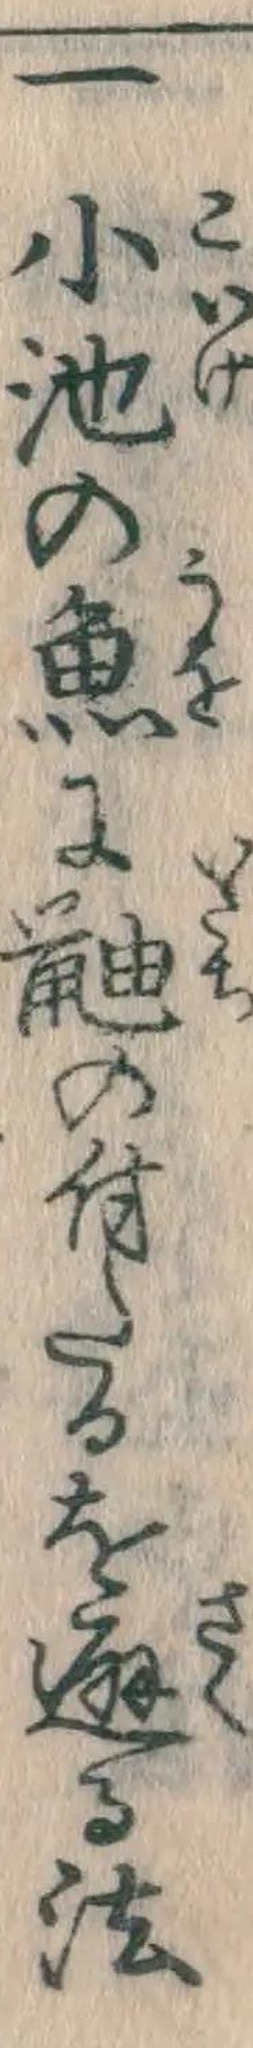一小池の魚に鼬の付たるを避る法
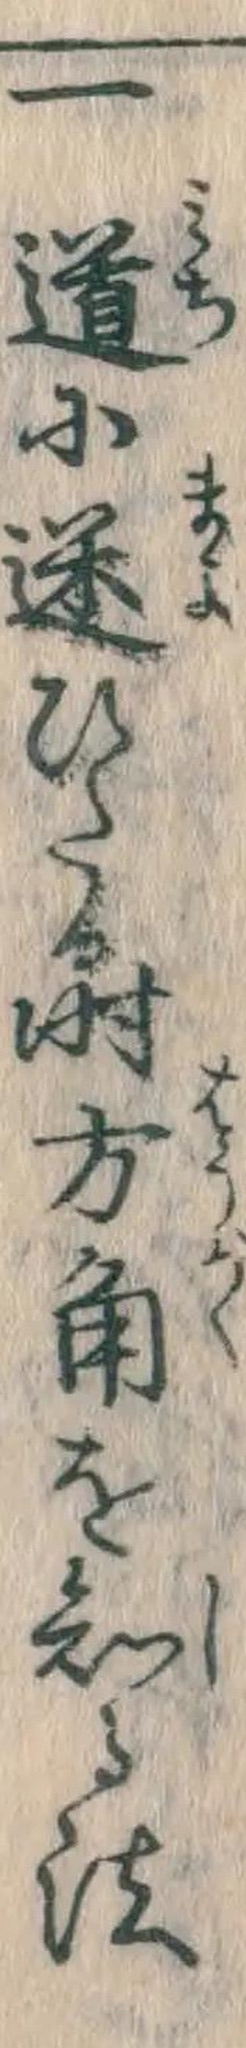一道に迷ひたる時方角を知る法
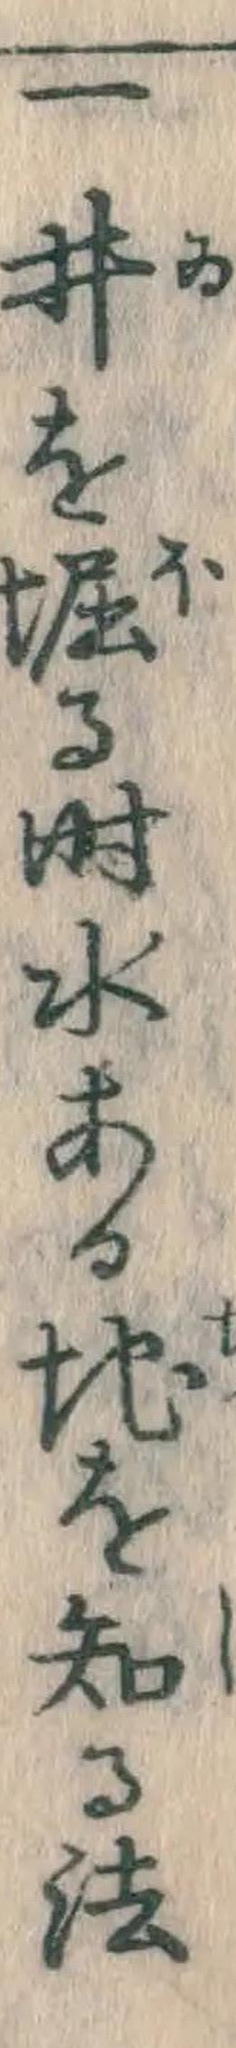一井を掘る時水ある地を知る法
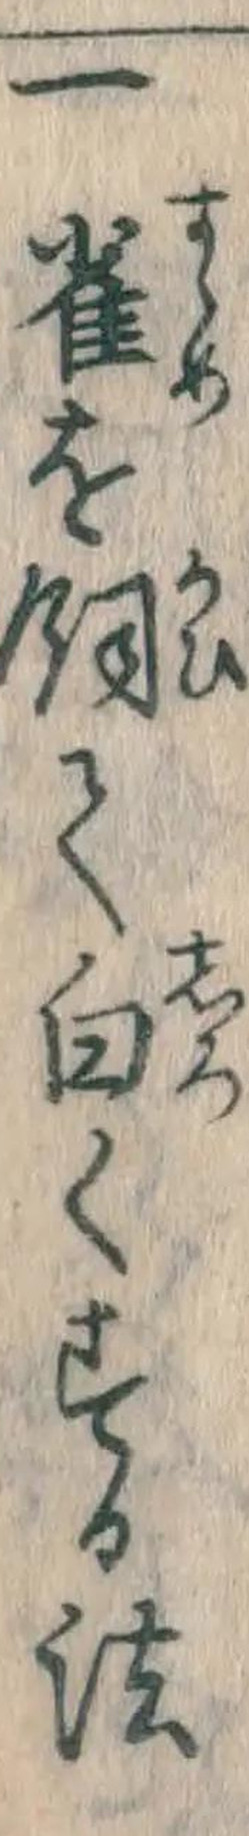一雀を飼て白くする法
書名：広益秘事大全 3巻. [1]
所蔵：国立国会図書館 National Diet Library, JAPAN
